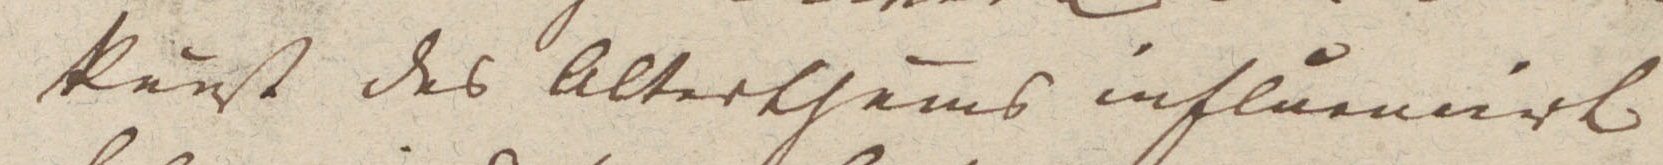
kunst des Alterthums influencirt
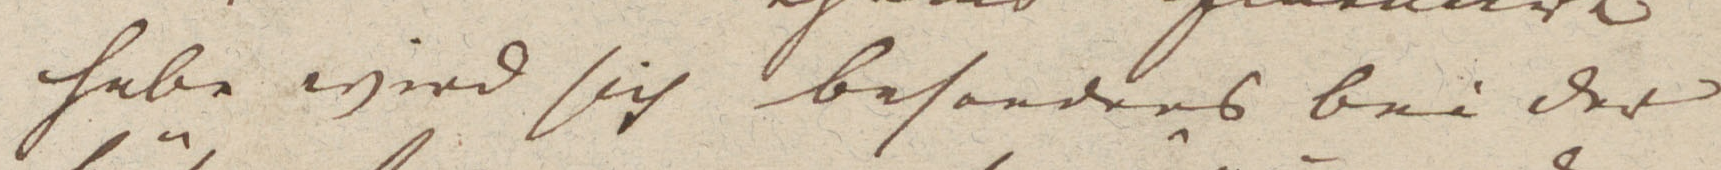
habe wird sich besonders bei der
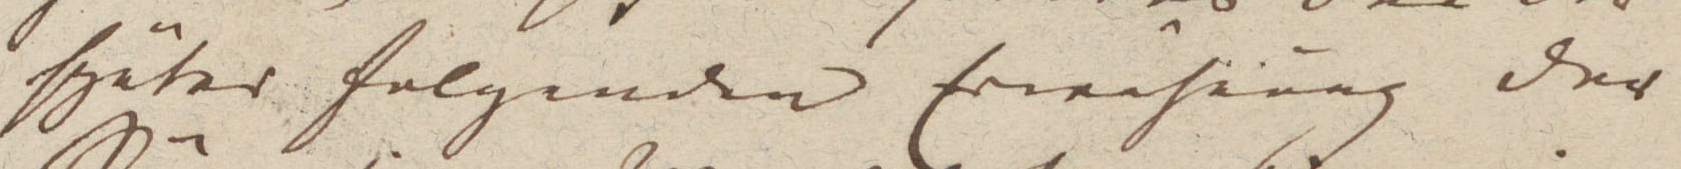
später folgenden Erwähnung der
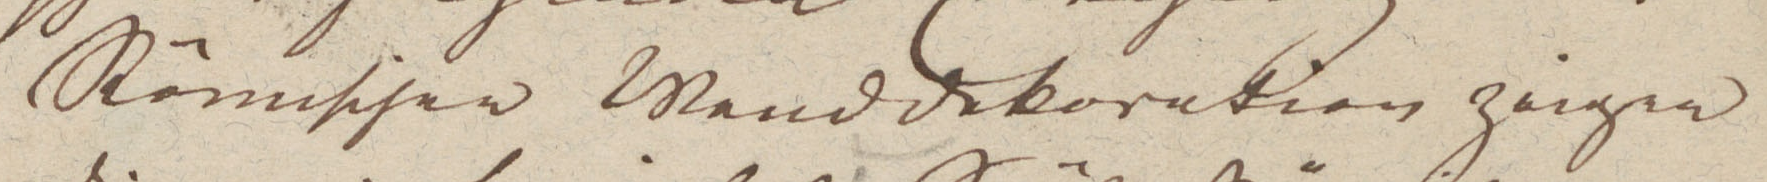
Römischen Wanddekorationn zeigen
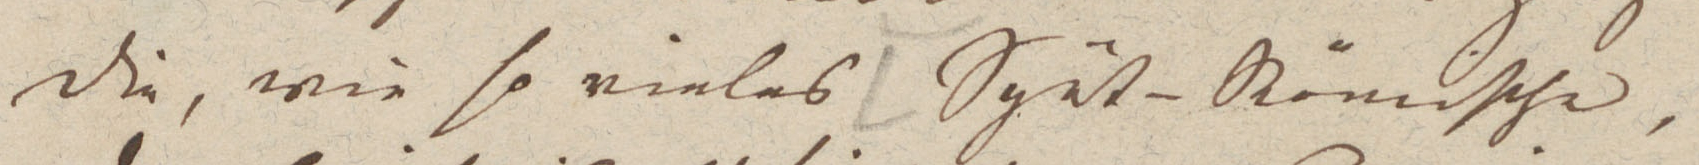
die, wie so vieles % Spät-Römische,
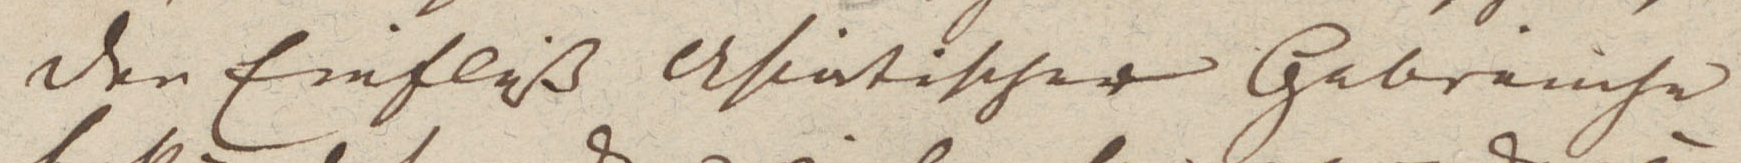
den Einfluss Asiatischer Gebräuche
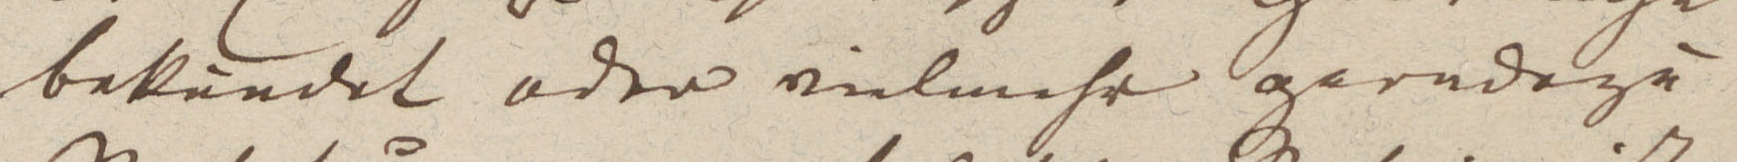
bekundet oder vielmehr geradezu
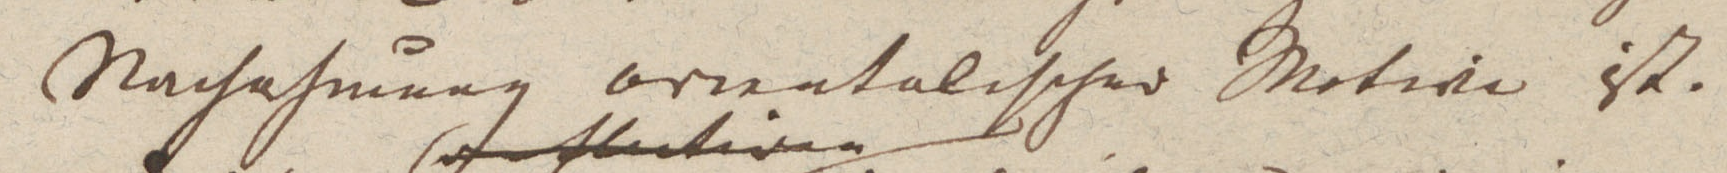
Nachahmung orientalischer Motive ist.
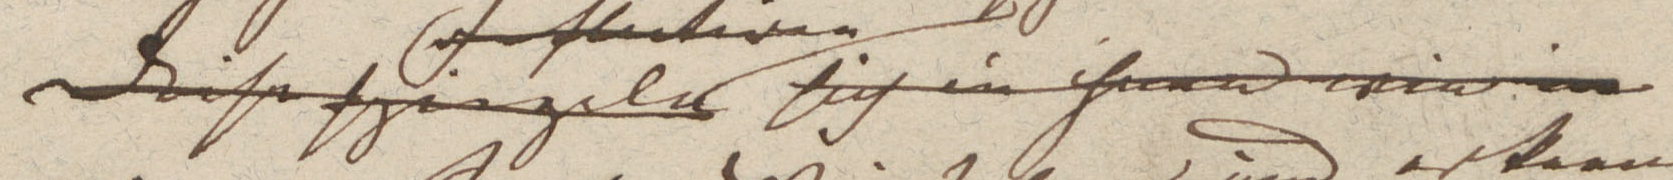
Diese spiegeln reflectiren sich in ihnen wie in
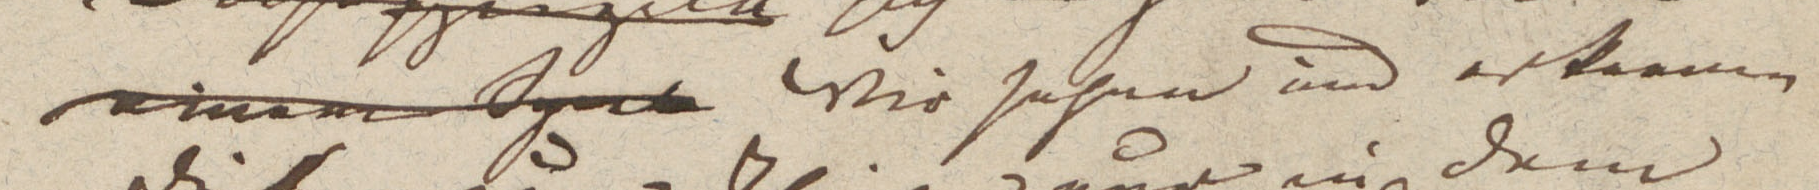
einem Spie Wir sehen und erkennen
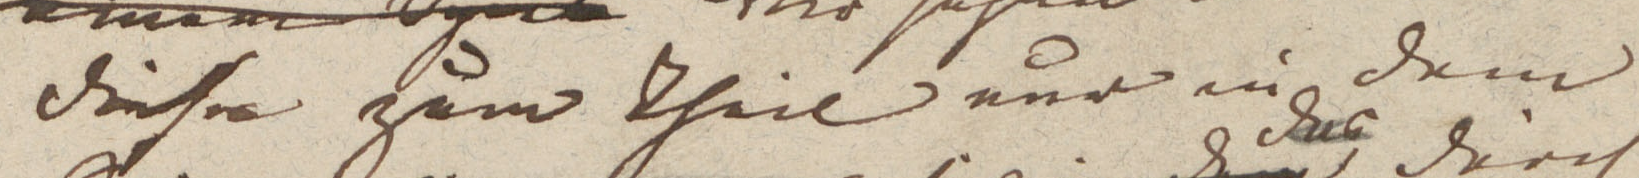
diese zum Theil nur in dem
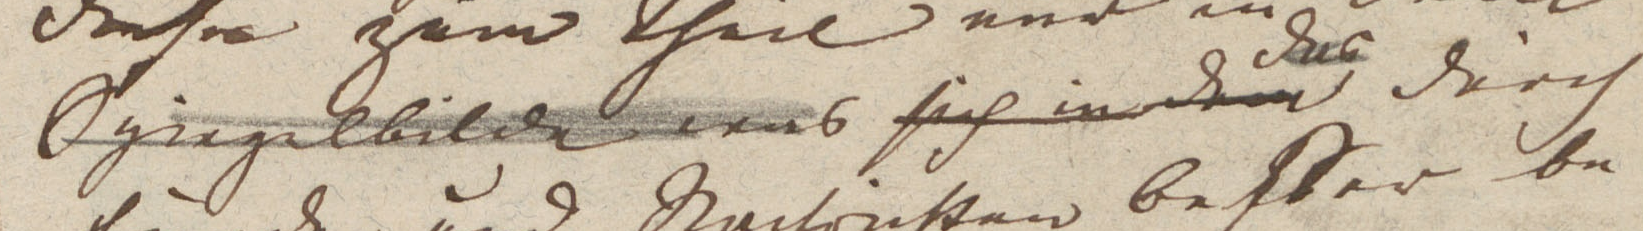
Spiegelbilde was sich in dem das durch
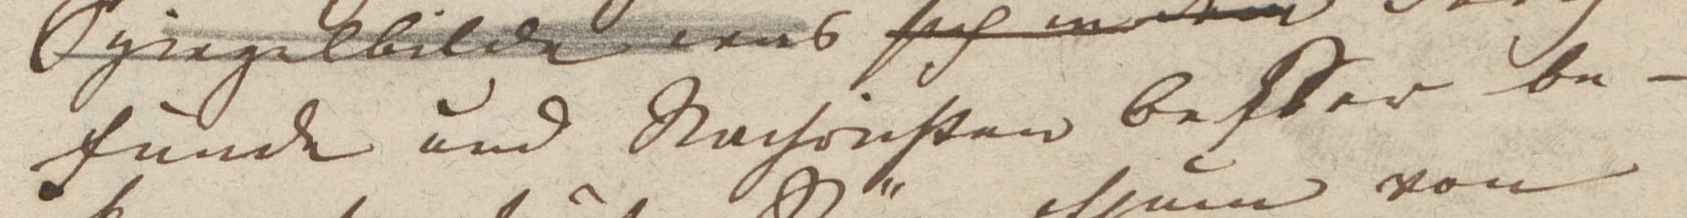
Funde und Nachrichten besser be-
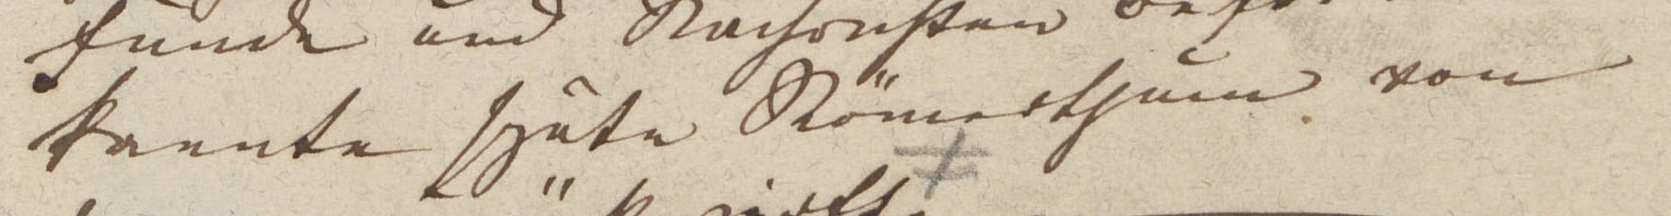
kannte späte Römerthum von
